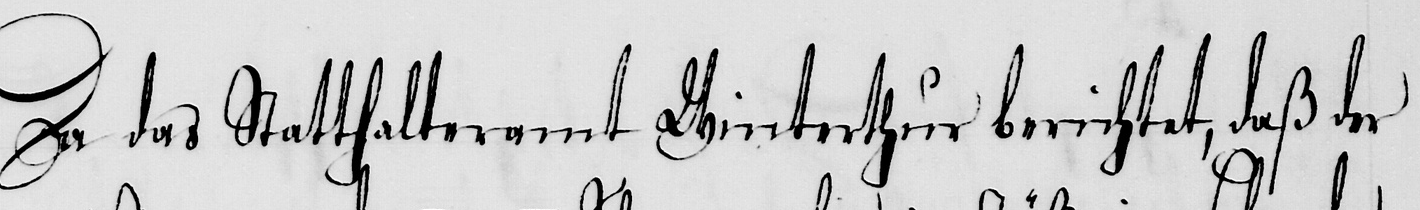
Da das Statthalteramt Winterthur berichtet, daß
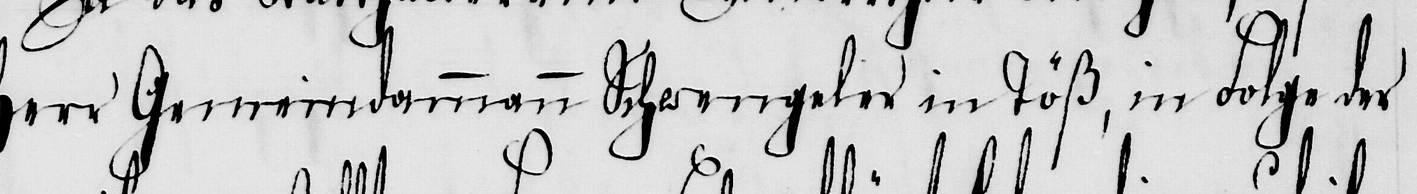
Herr Gemeindammann Schwengeler in Töß, in Folge der
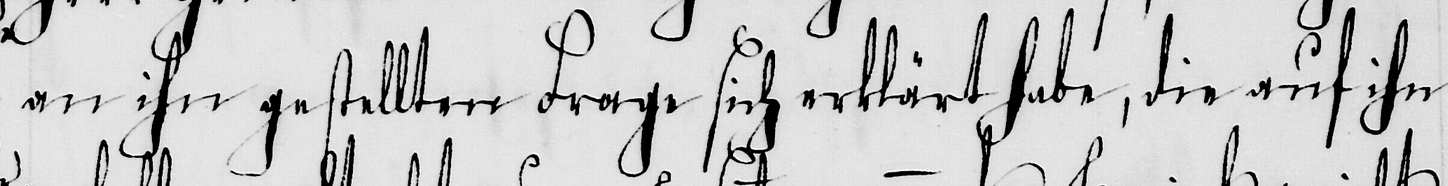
an ihn gestellten Frage sich erklärt habe, die auf ihn
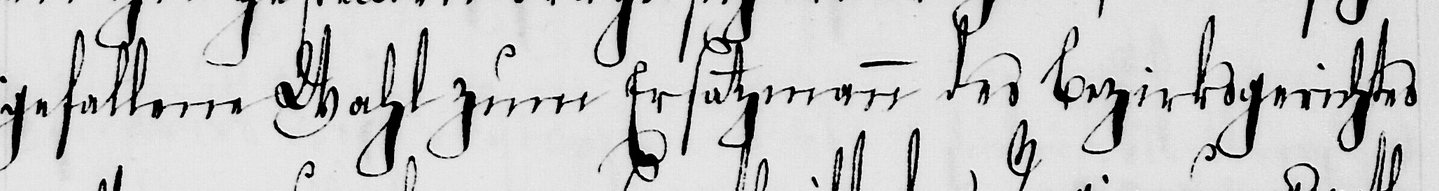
gefallene Wahl zum Ersatzmann des Bezirksgerichtes
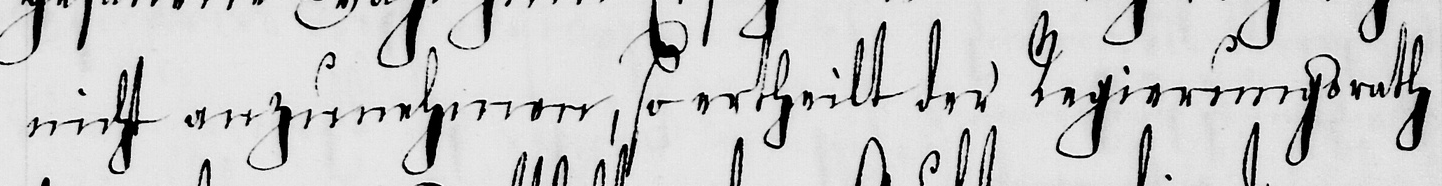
nicht anzunehmen, so ertheilt der Regierungsrath
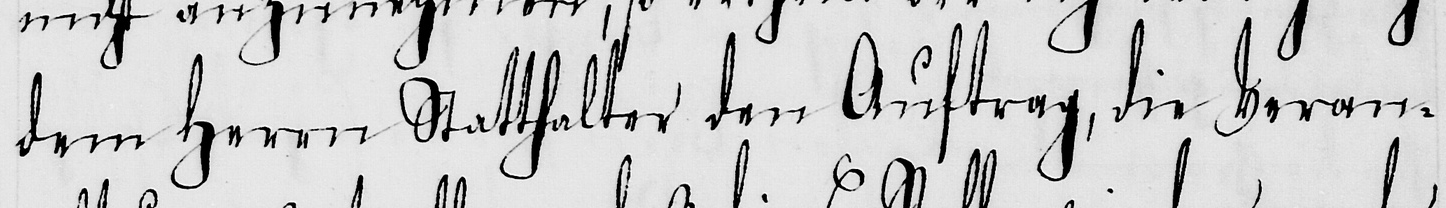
dem Herrn Statthalter den Auftrag, die Veran¬
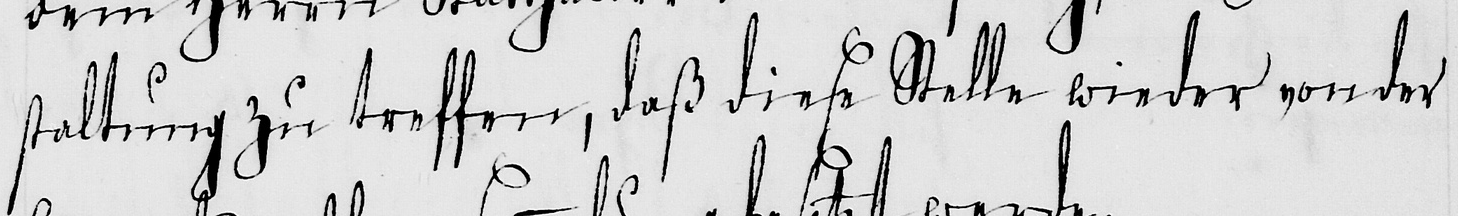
staltung zu treffen, daß diese Stelle wieder von der
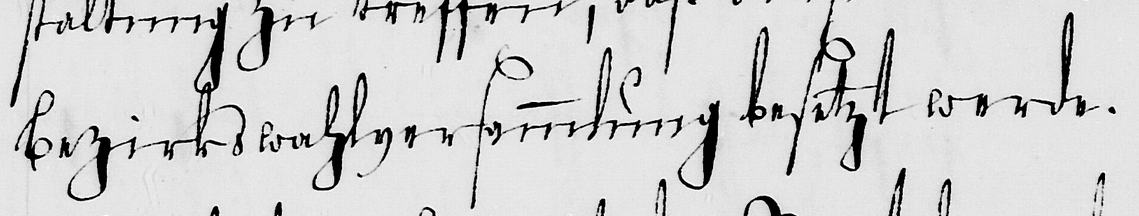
Bezirkswahlversammlung besetzt werde.
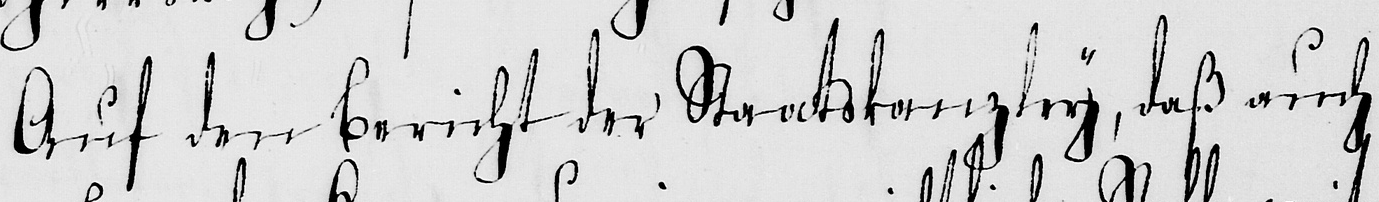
Auf den Bericht der Staatskanzley, daß auch
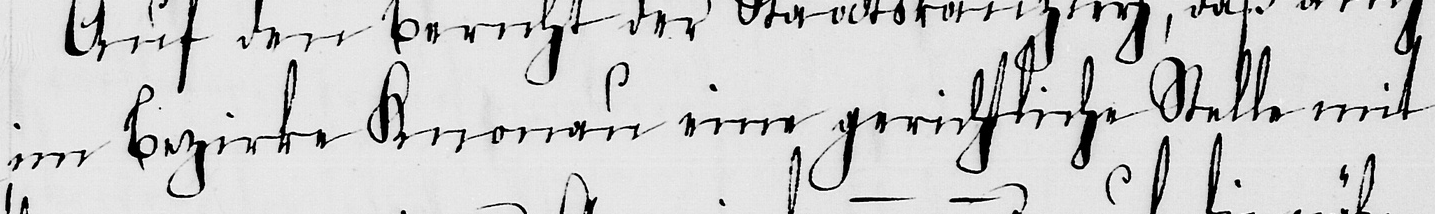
im Bezirke Knonau eine gerichtliche Stelle mit
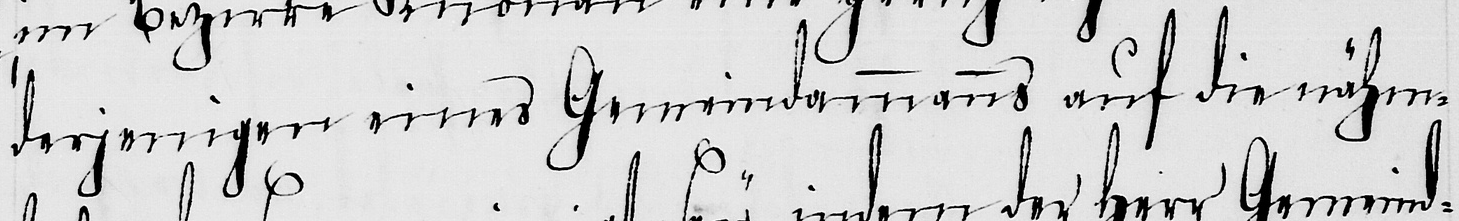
derjenigen eines Gemeindammanns auf die nähm¬
